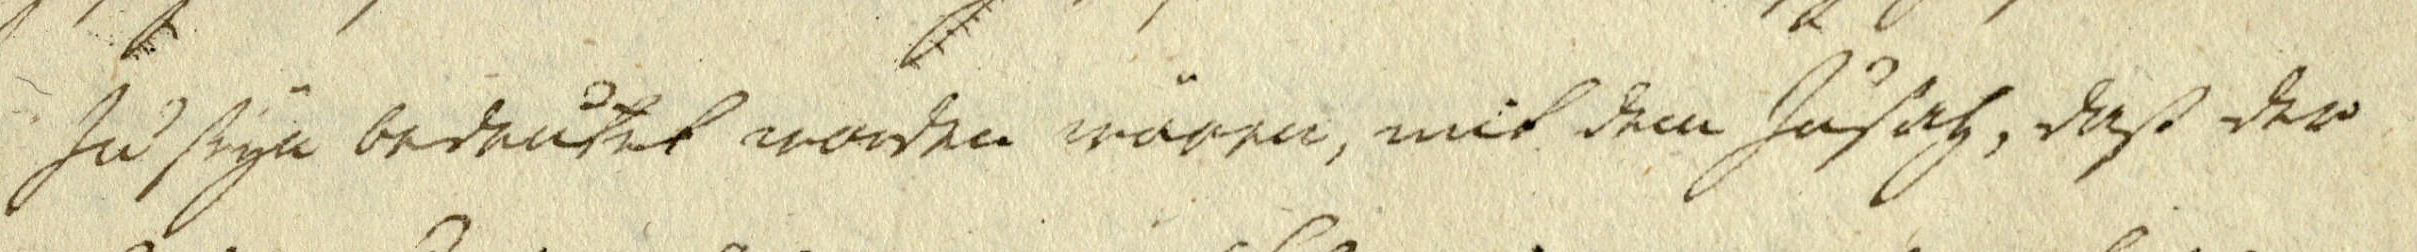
zu seÿn bedeudet worden wären, mit dem Zusatz, daß der
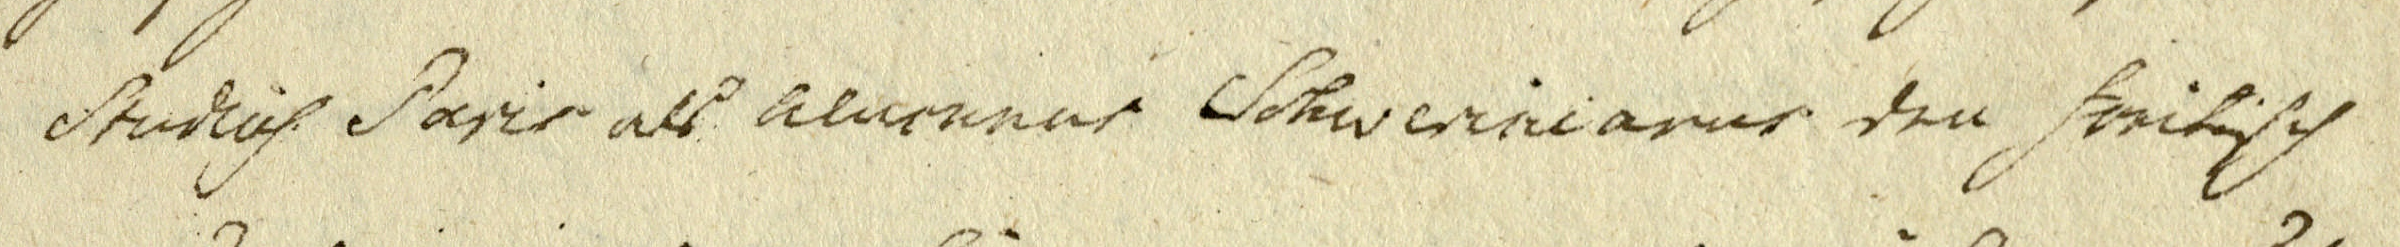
Studios Paris als Alumnus Schwerinianus den Freitisch
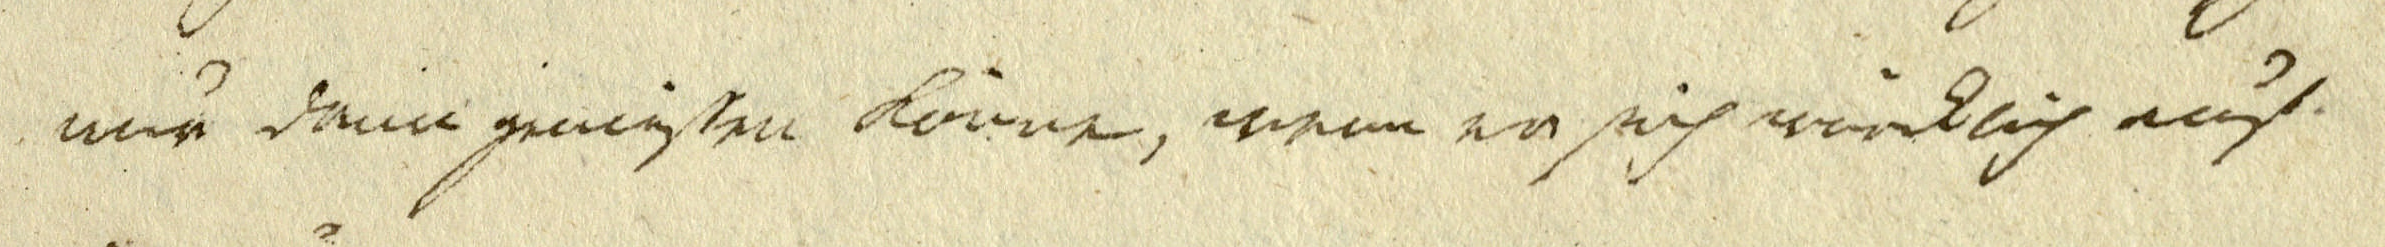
nur dann geniessen könne, wenn er sich würcklich auf
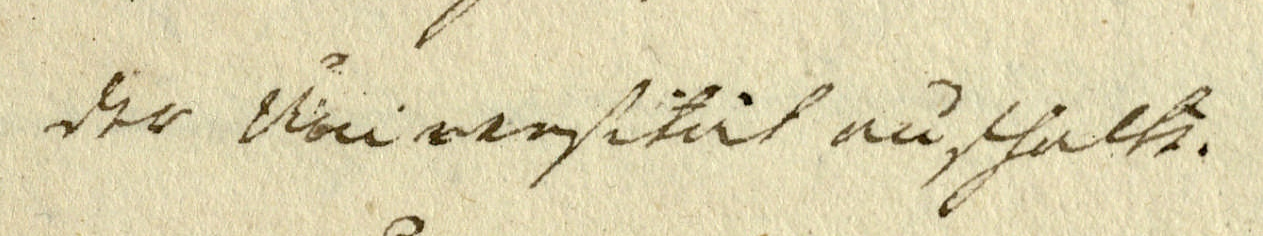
der Universität aufhalte.
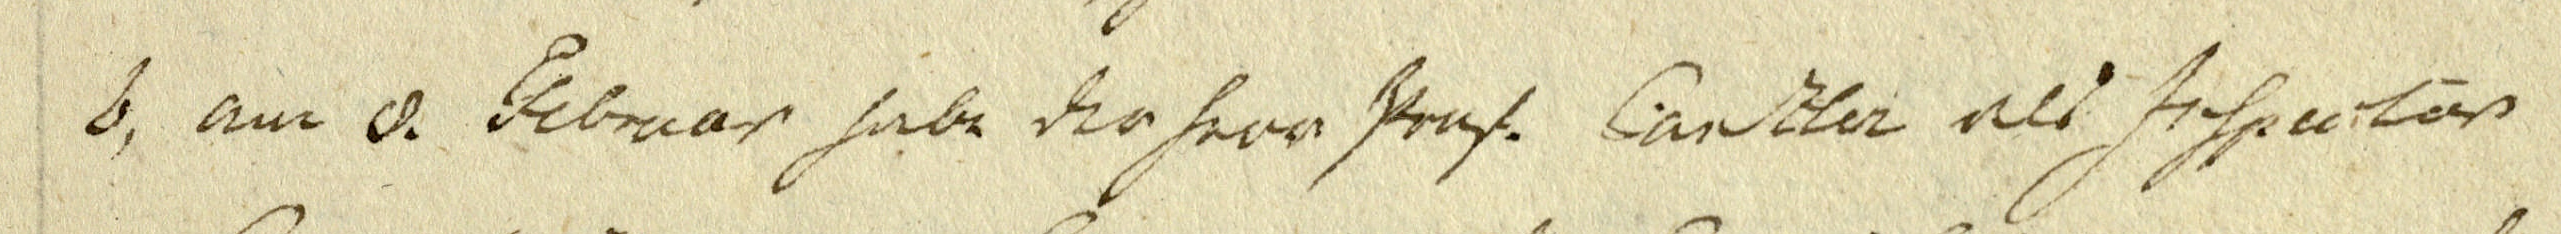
b., Am 8. Februar habe der Herr Prof. Canzler als Inspector
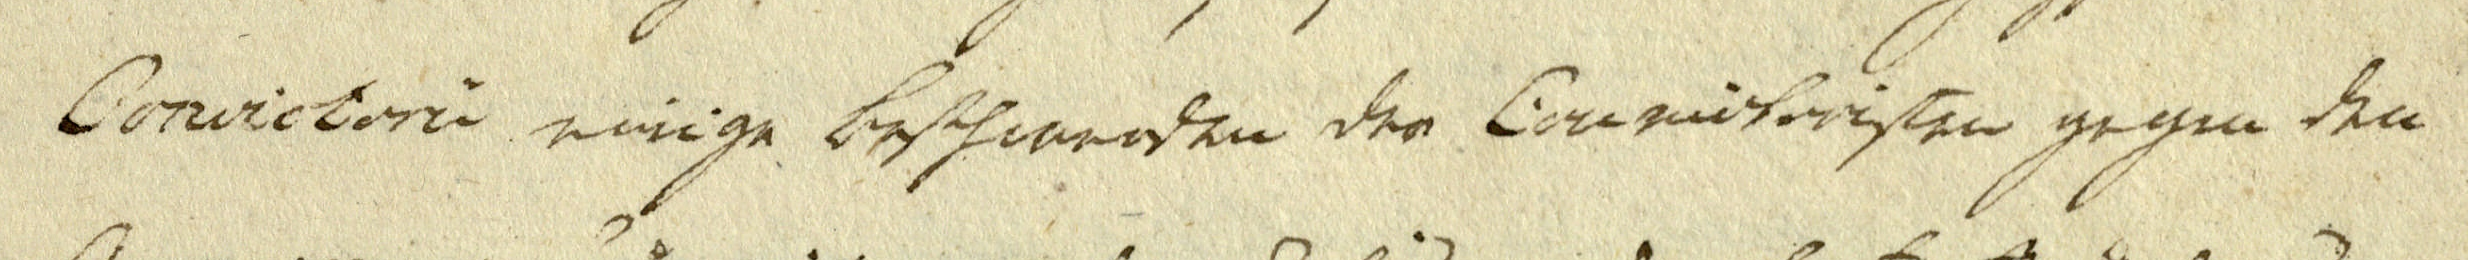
Convictorii einige Beschwerden der Convictoristen gegen den
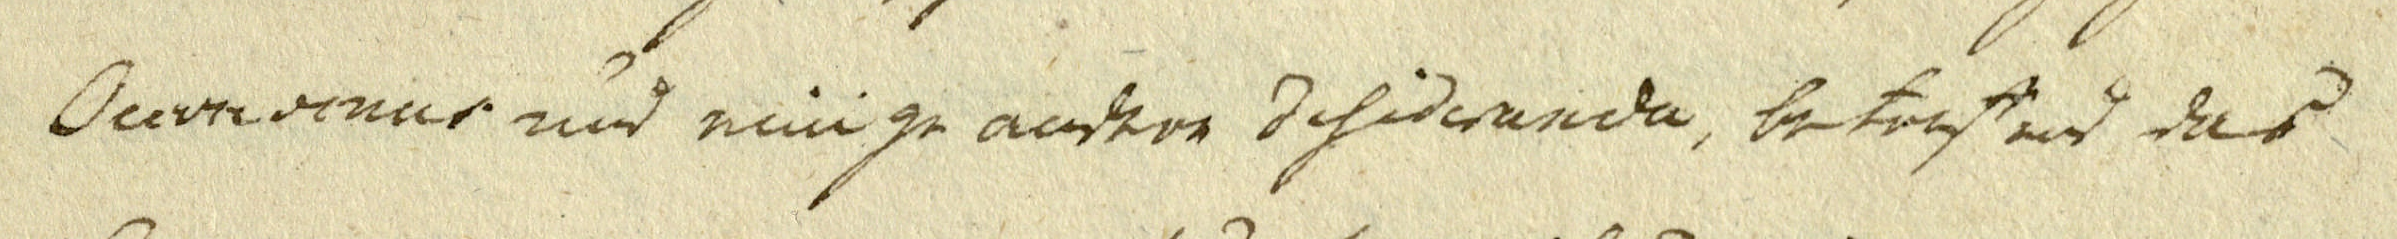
Oeconomus und einige andere desideranda, betreffend das
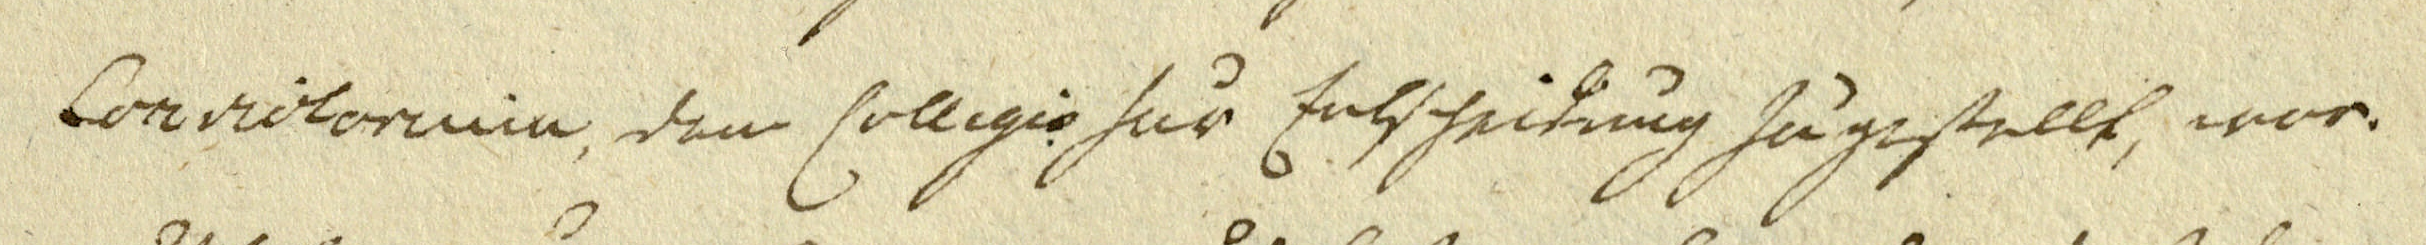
Convictorium, dem Collegio zur Entscheidung zugestellt, wor¬
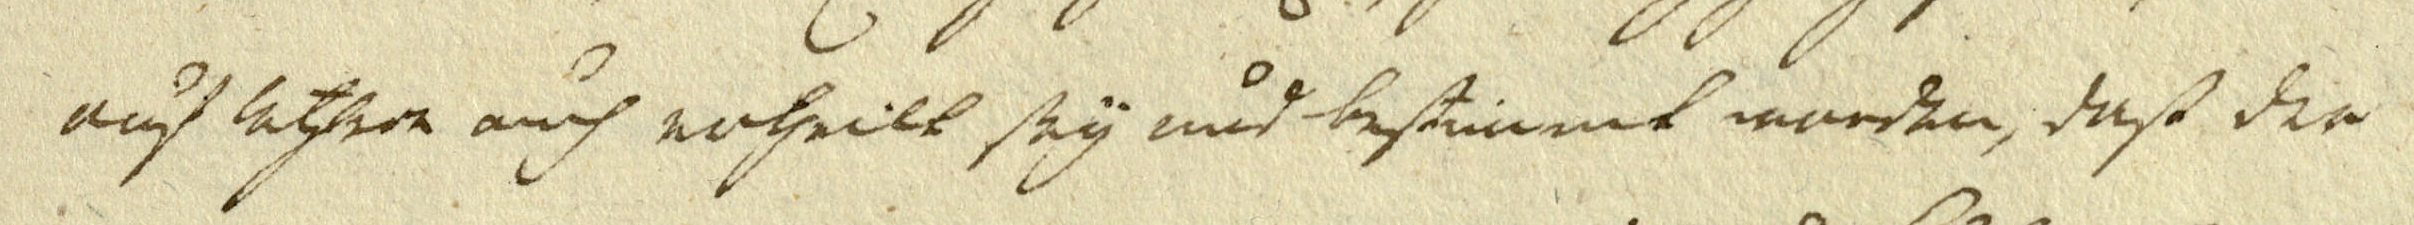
auf letztere auch ertheilt seÿ und bestimmt worden, daß der
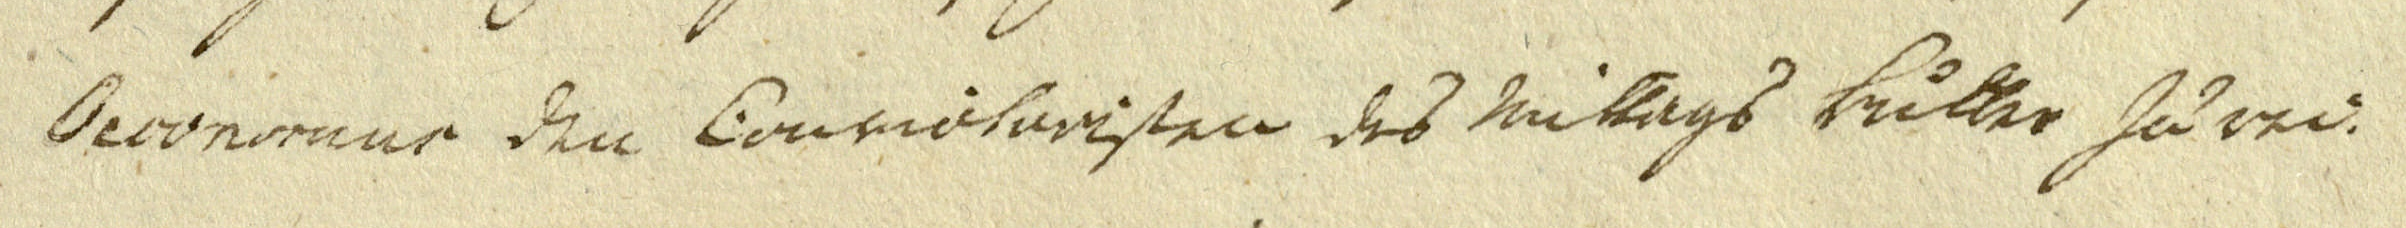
Oeconomus den Convictoristen des Mittags Butter zu rei¬
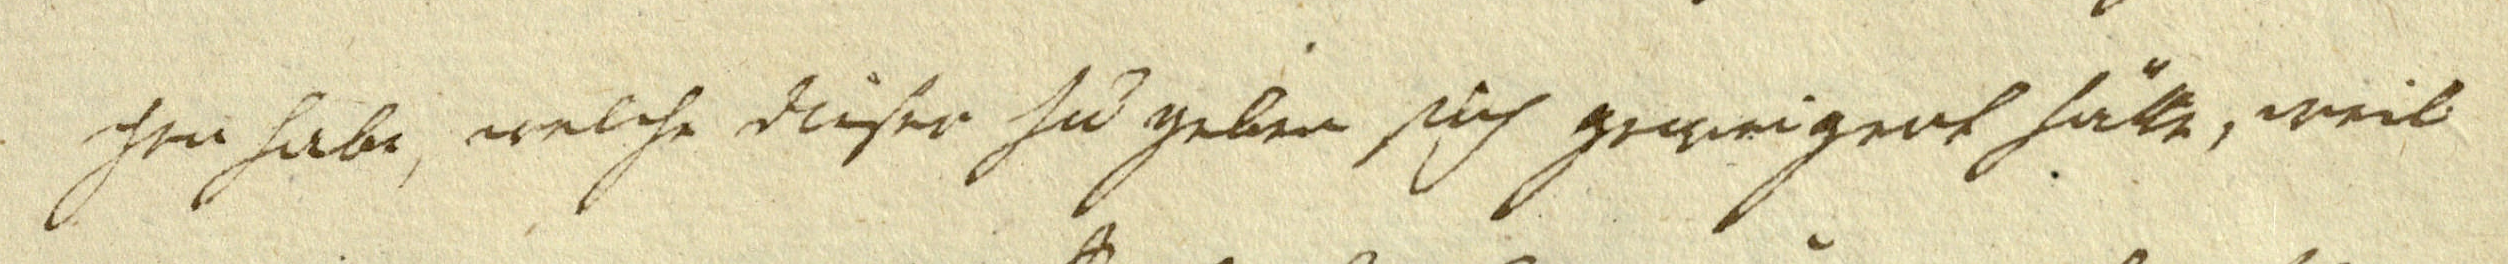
chen habe, welche dieser zu geben sich geweigert hätte, weil
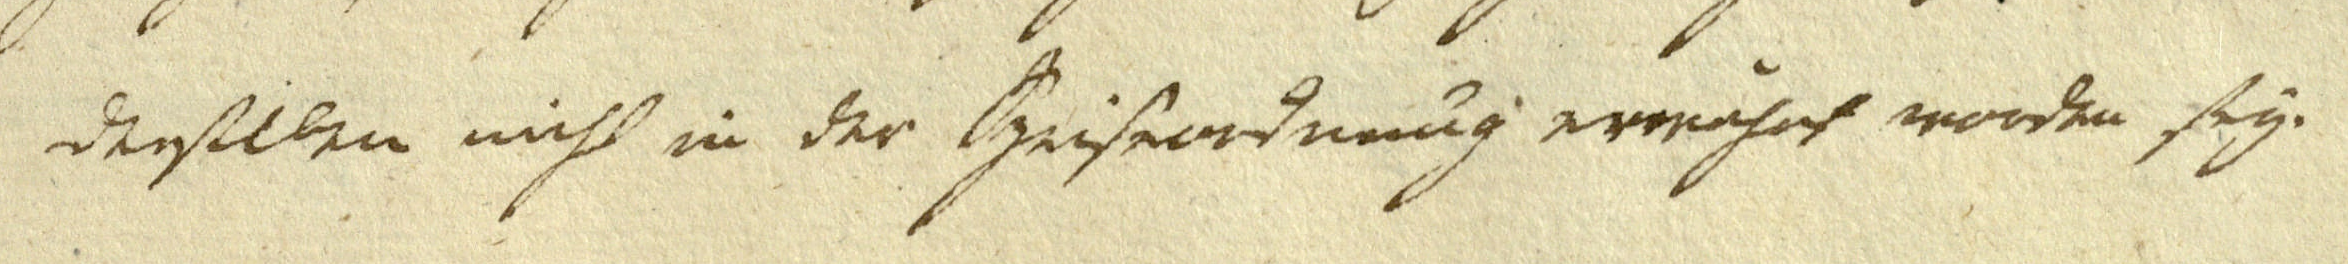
derselben nicht in der Speiseordnung erwähnt worden seÿ.
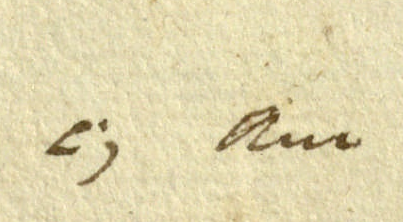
c, Am
